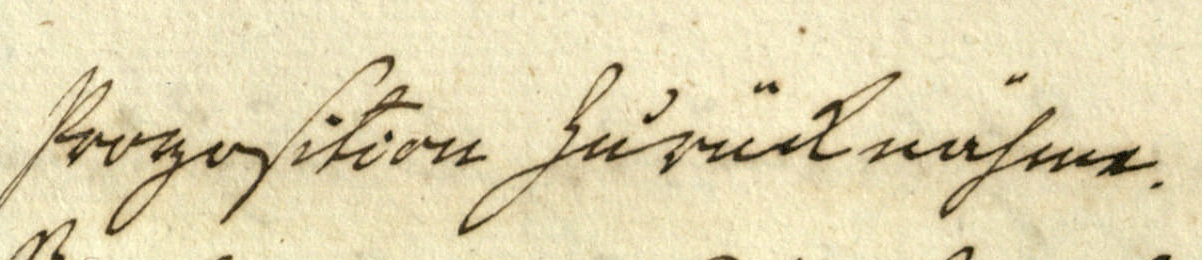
Proposition zurücknähme.
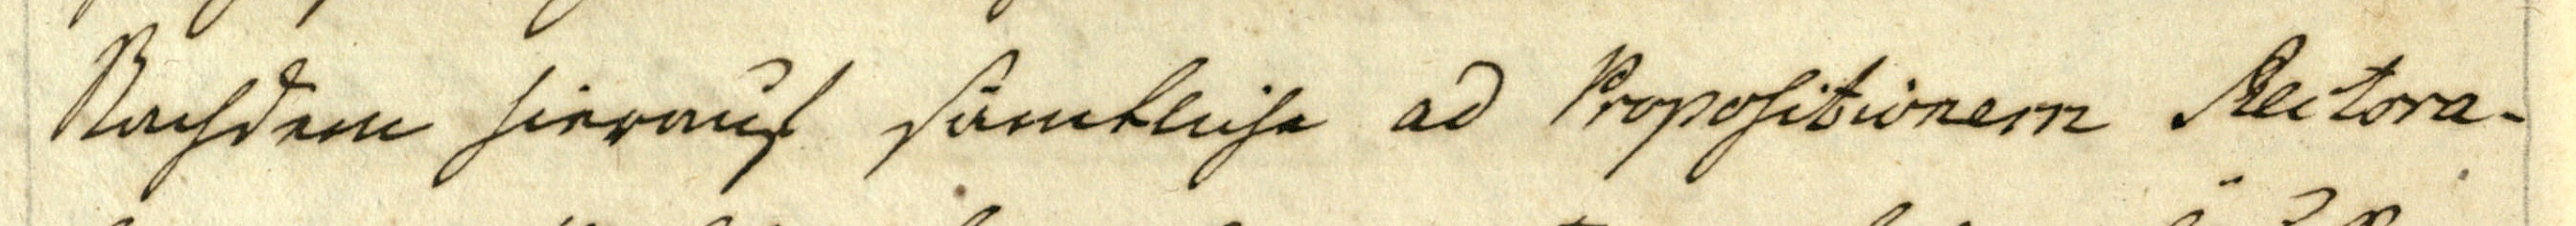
Nachdem hierauf sämtliche ad Propositionem Rectora¬
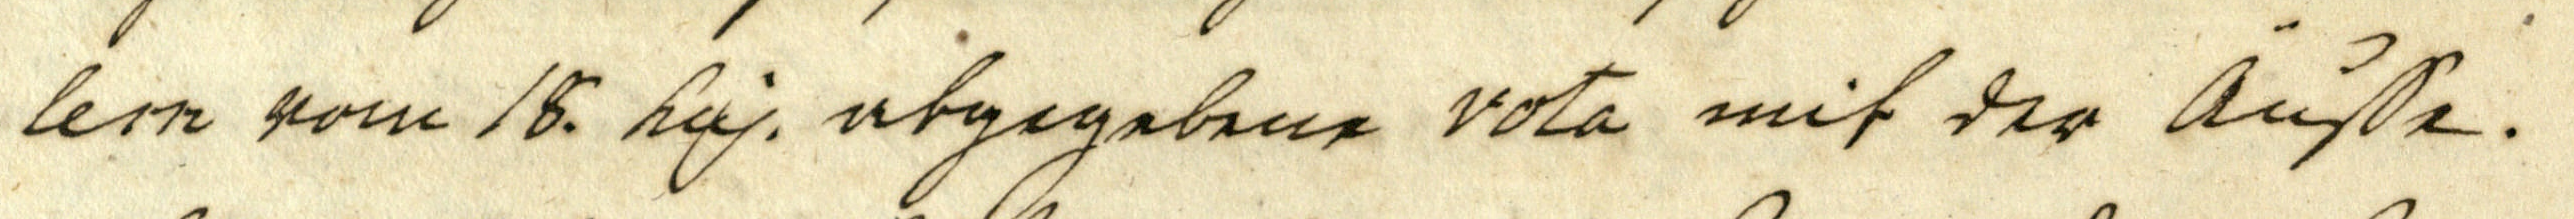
lem vom 18. huj. abgegebene vota mit der Äusse¬
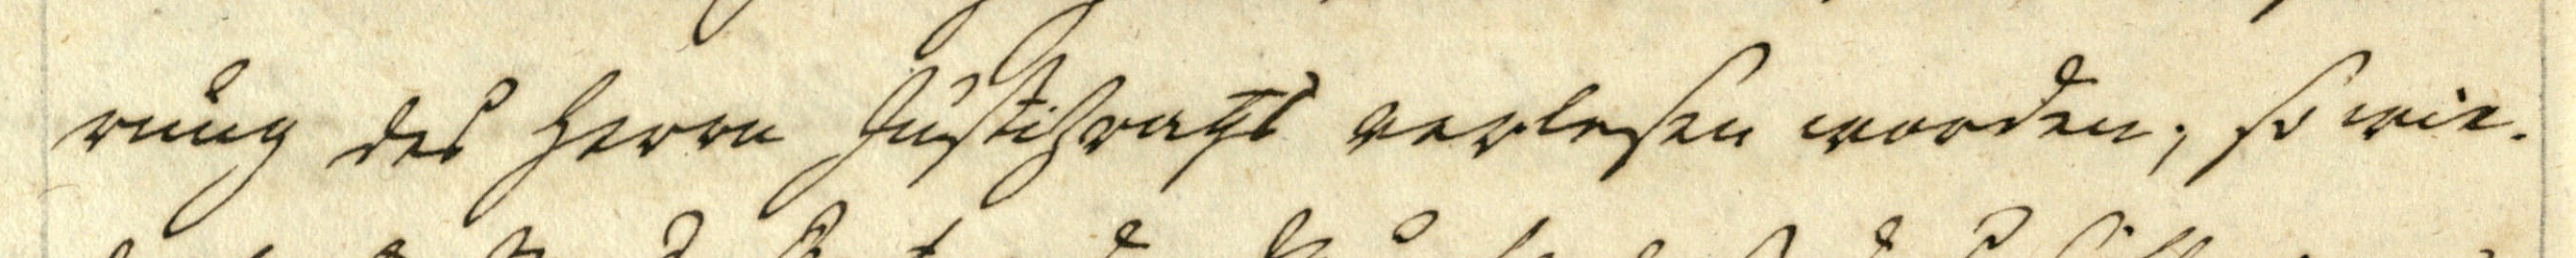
rung des Herrn Justiz¬raths verlesen worden, so wie
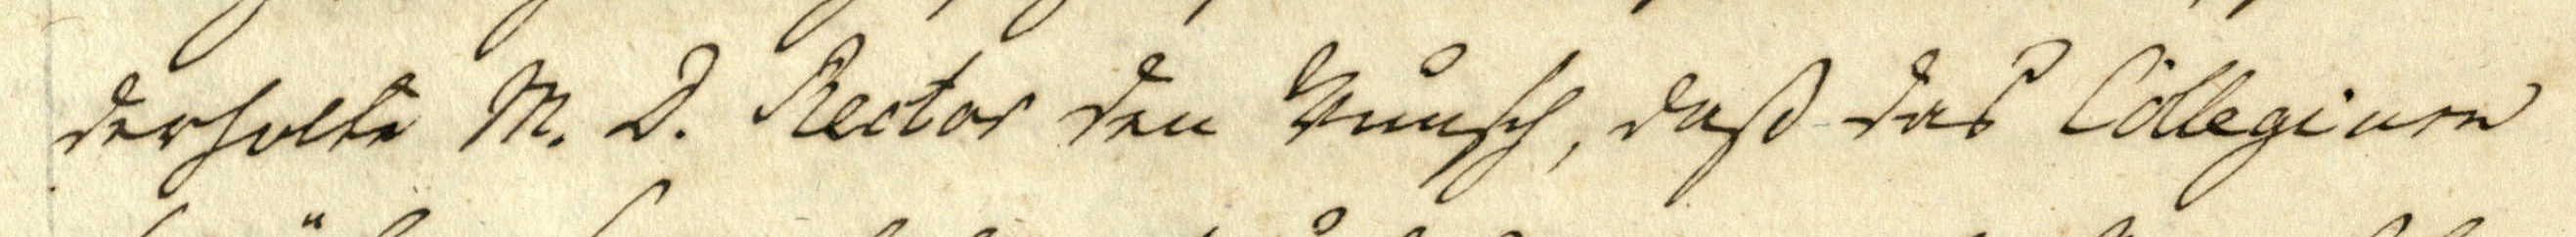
derholte M. D. Rector den Wunsch, daß das Collegium
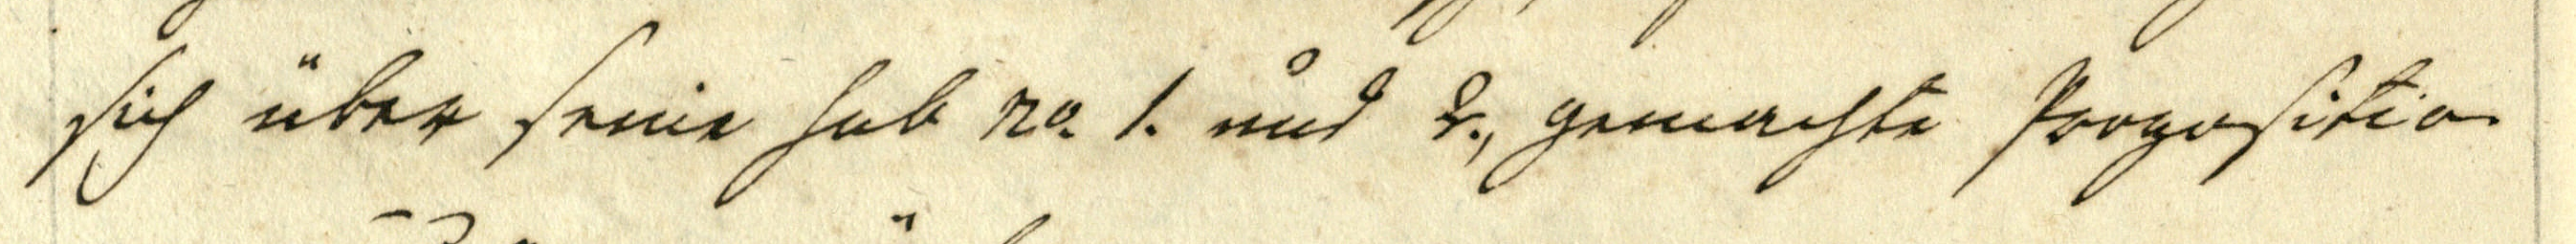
sich über seine sub No. 1. und 2., gemachte Propositio¬
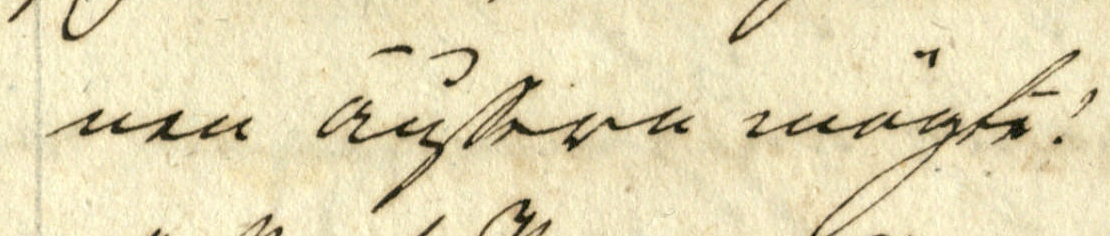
nen äussern mögte.
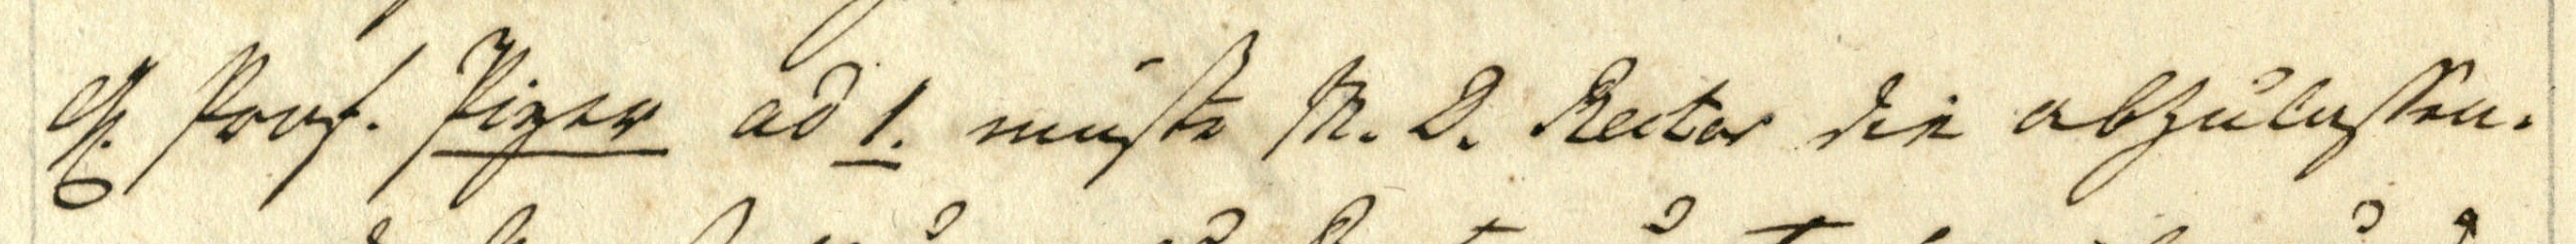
dh. Prof. Piper. ad 1. müßte M. D. Rector die abzulassen¬
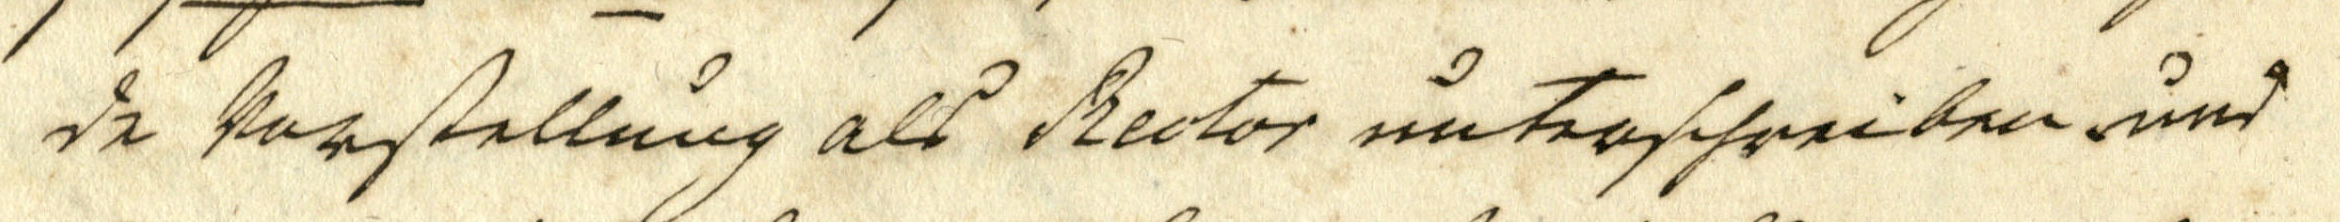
de Vorstellung als Rector unterschreiben und
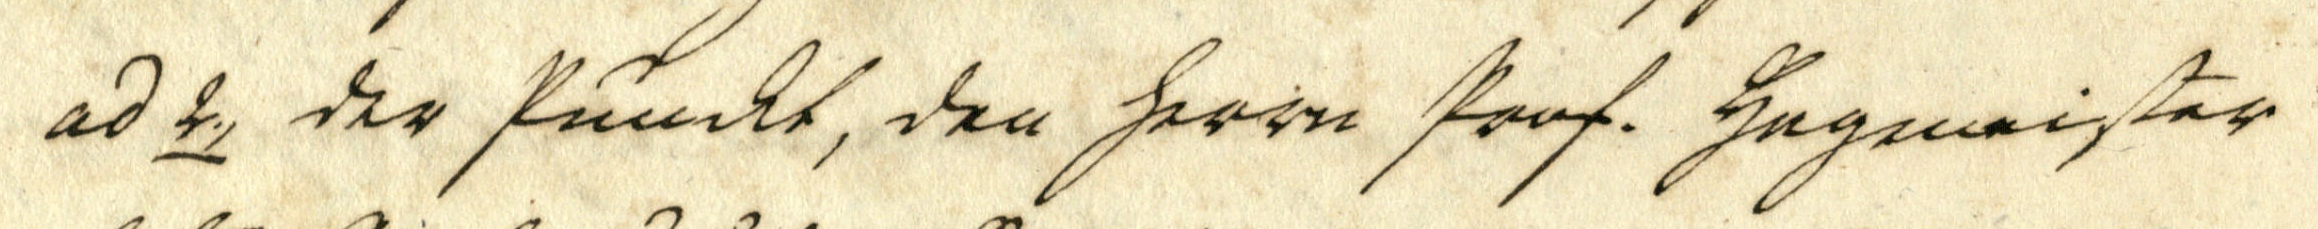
ad 2. der Punckt, den Herrn Prof. Hagemeister
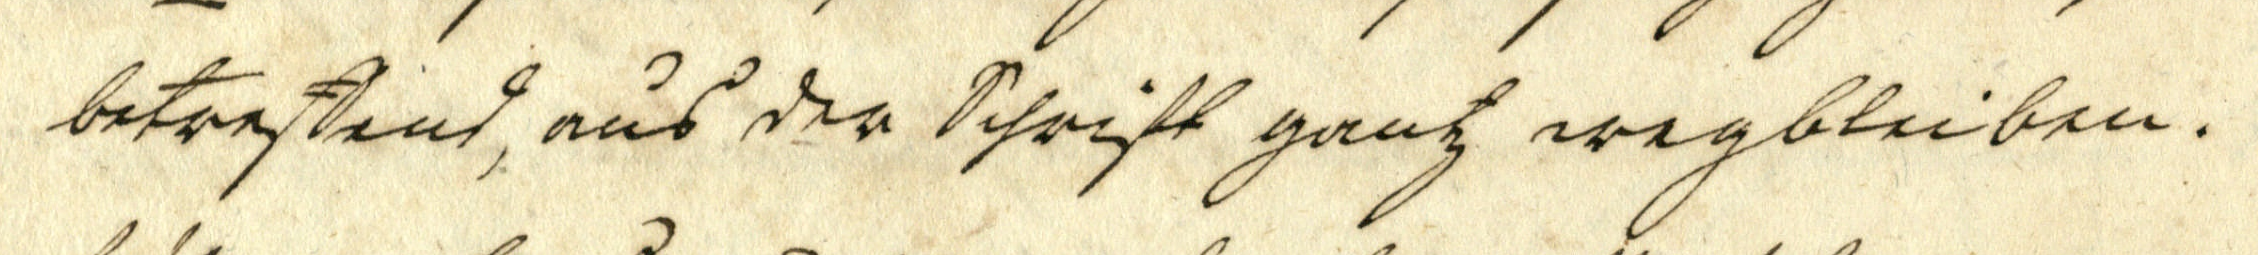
betreffend, aus der Schrift gantz wegbleiben.
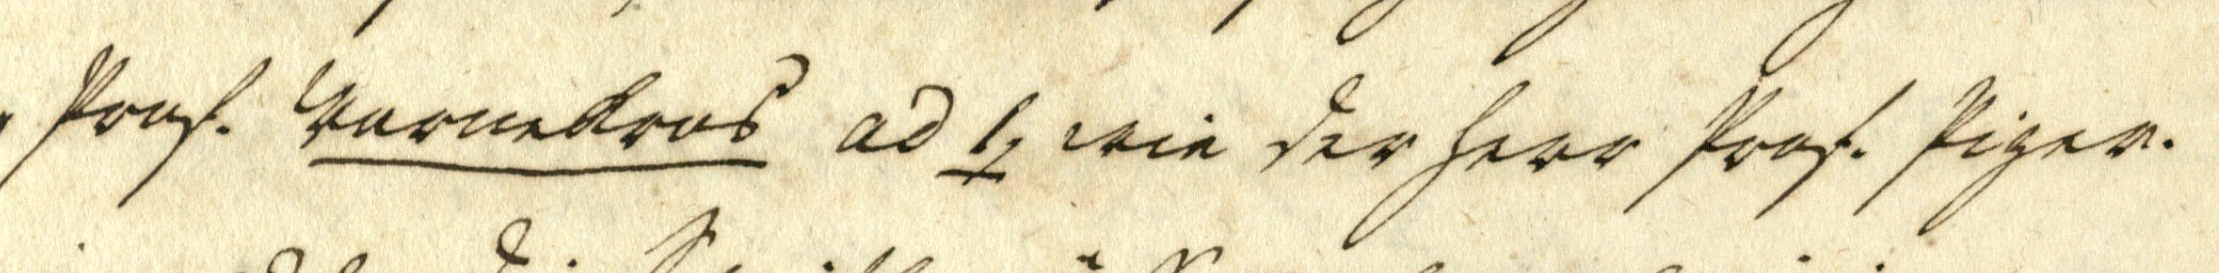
Prof. Warnekros ad 1. wie der Herr Prof. Piper.
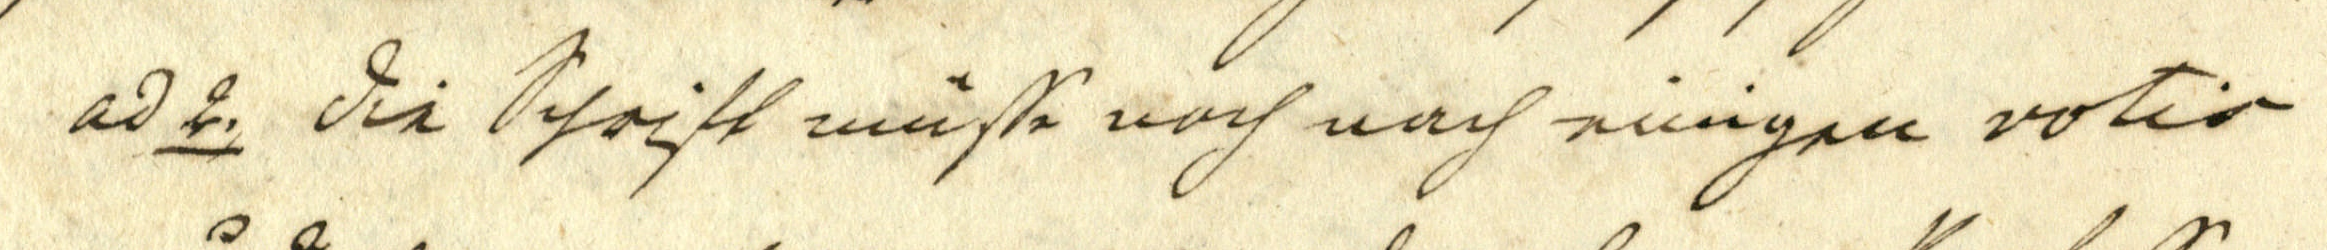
ad 2., die Schrift müsse noch nach einigen votis
